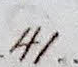41
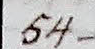54
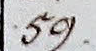59
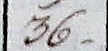36
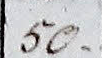50
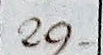29
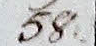58
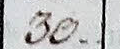30.
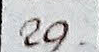29
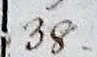38
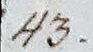43
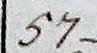57
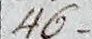46
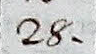28
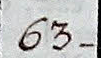63
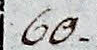60
